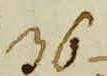36
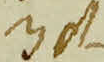38
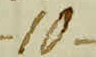10
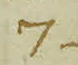7
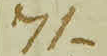70
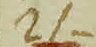21
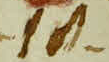18
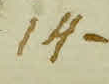14
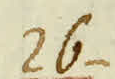26
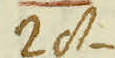28
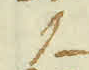1
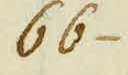66
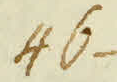46
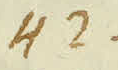42
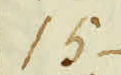15
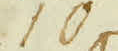10
